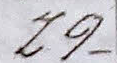29
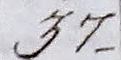37
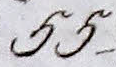55
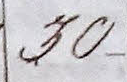30
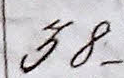38
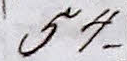54
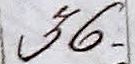36
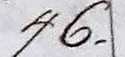46
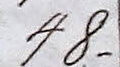48
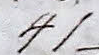41
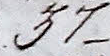37
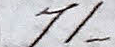71
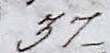37
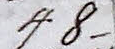48
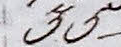35
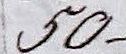50
